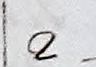2
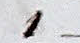1
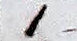1
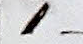1
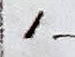1
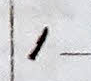1
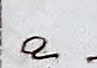2
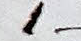1
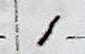1
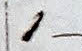1
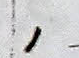1
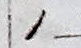1
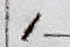1
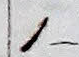1
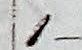1
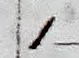1
